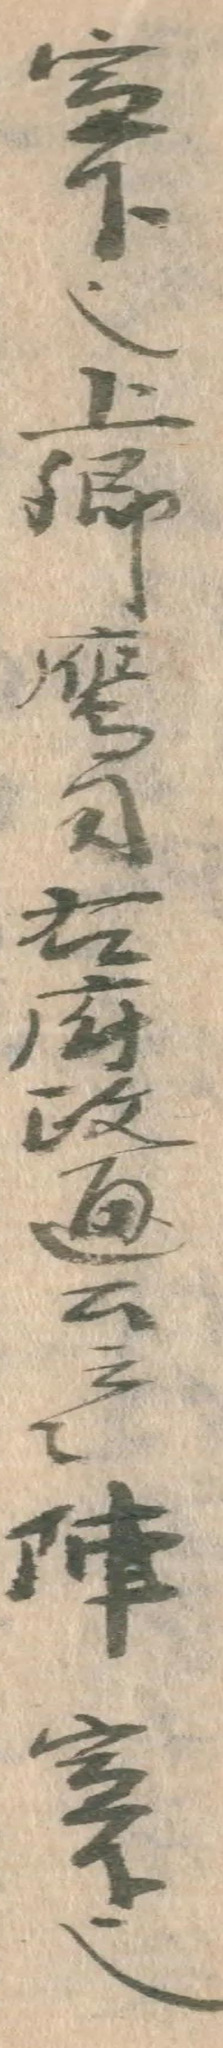宣下也、上卿鷹司右府政通公云々、陣宣下也、
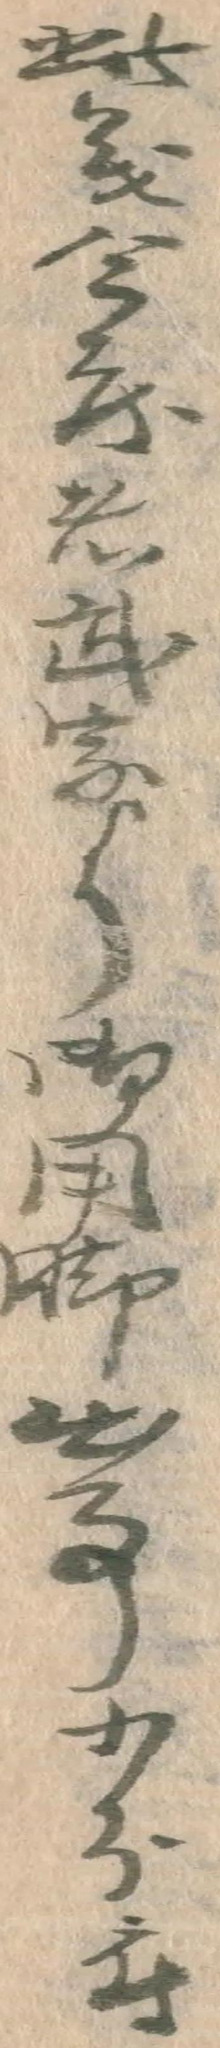此義、今度者武家より御用脚出事、少分ニ付
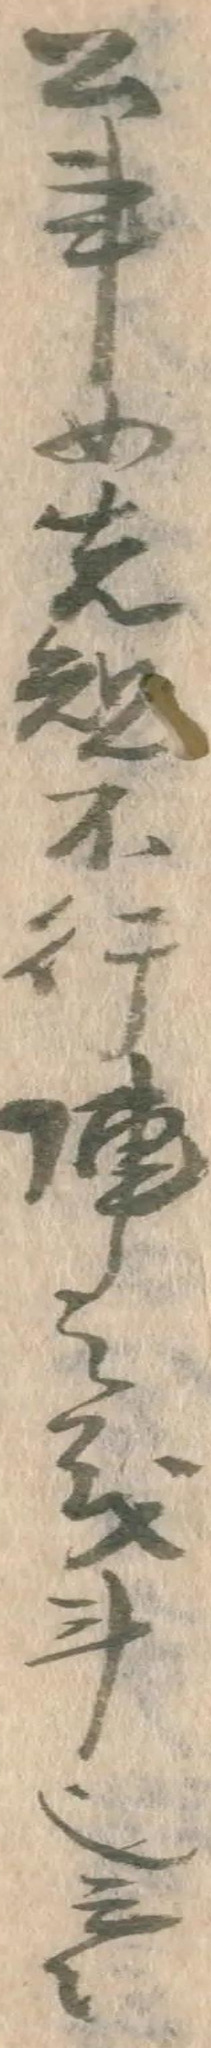公事如先祖不行陣之義斗也云々、
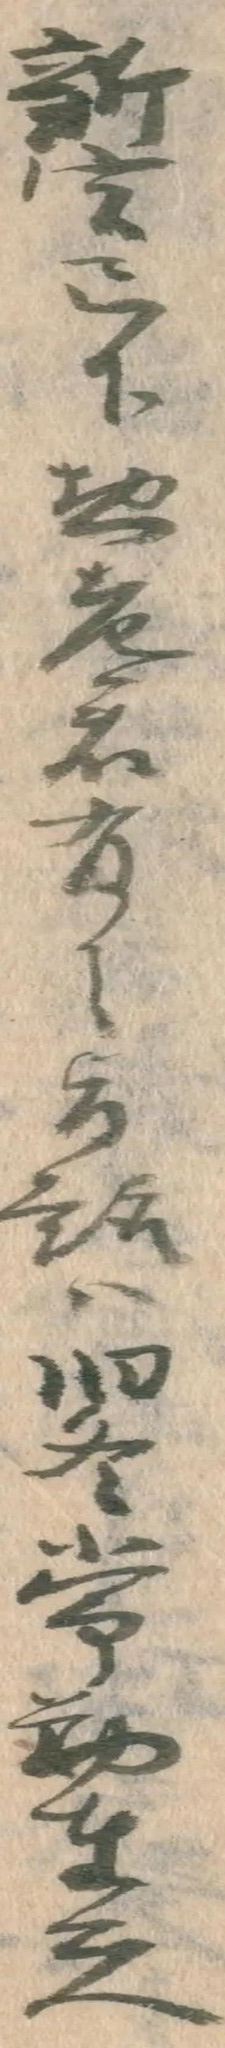新宮已下惣老若有之、旨趣ハ旧冬常勤奉公人
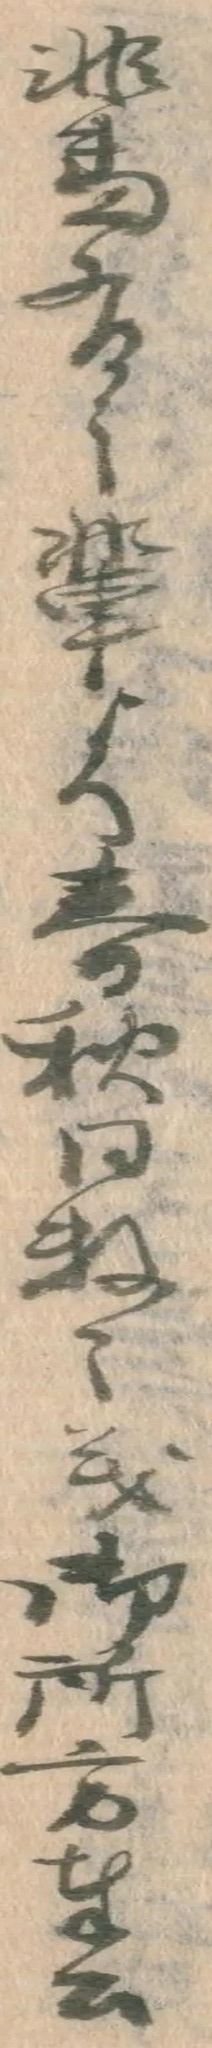非番有之輩より、春秋日数之義御所方奉公
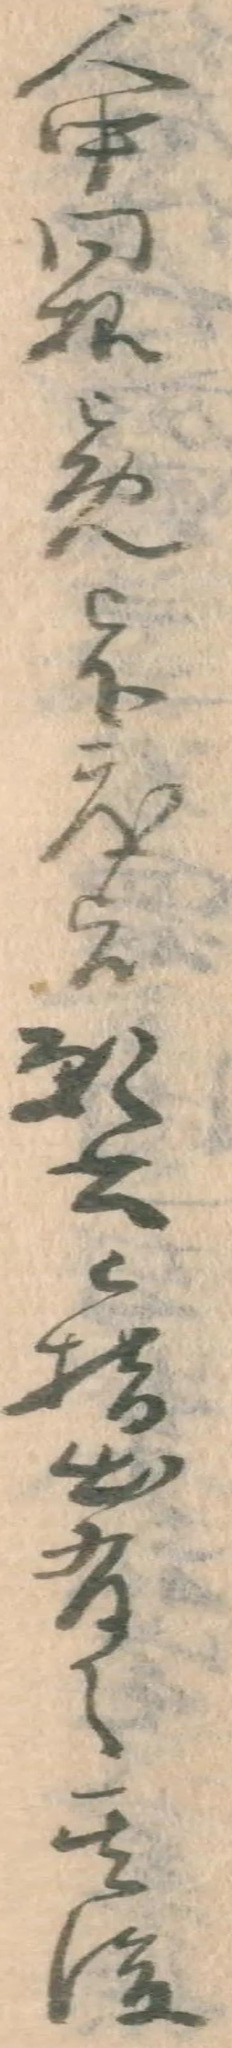人中同様被免被下度旨、願書被指出有之、其後
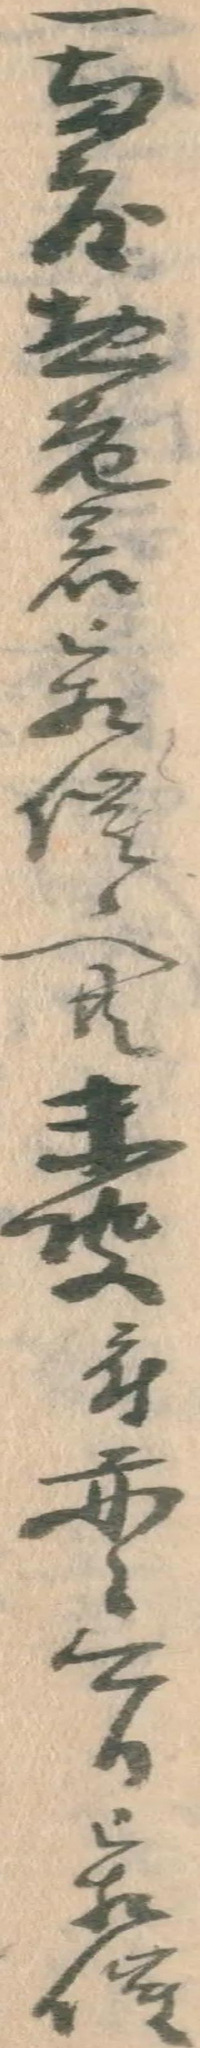一両度惣老若被相催候へ共、未決ニ付、亦々今日被相伴
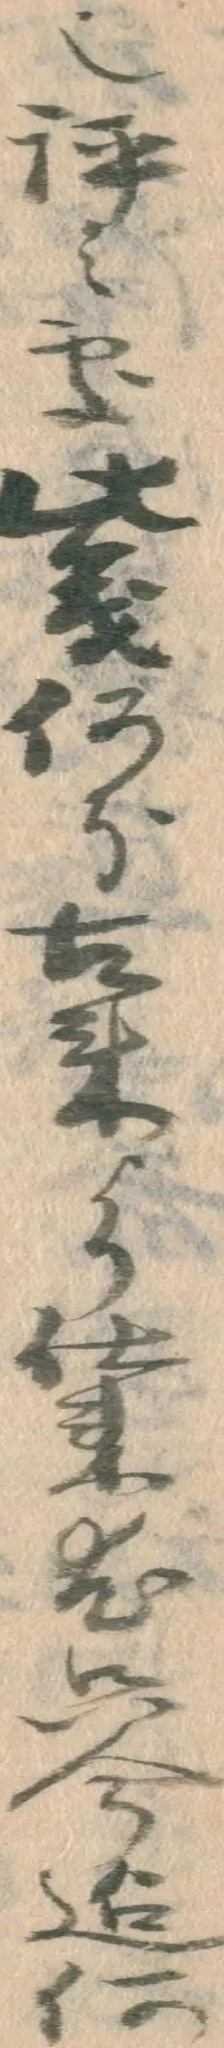之評之處、此義何分古来より仕来、尤只今迄何
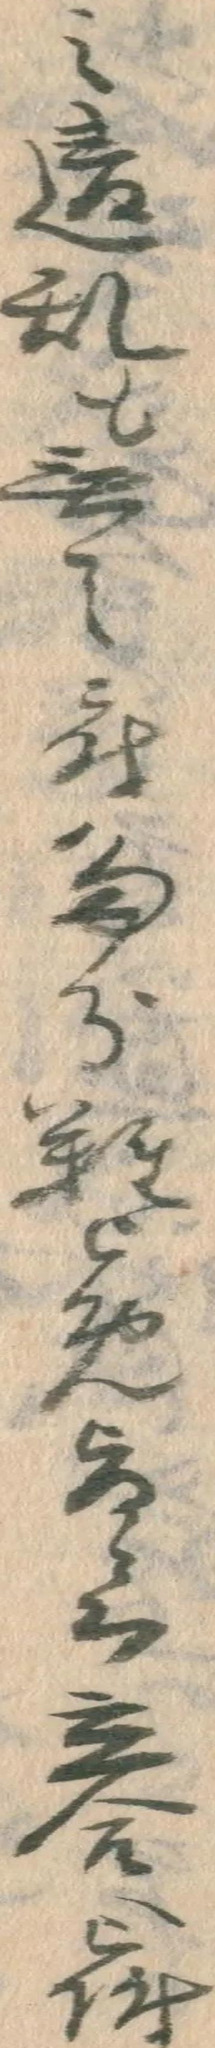之違乱も無之ニ付、多分難被免旨ニ而、立合へ被附
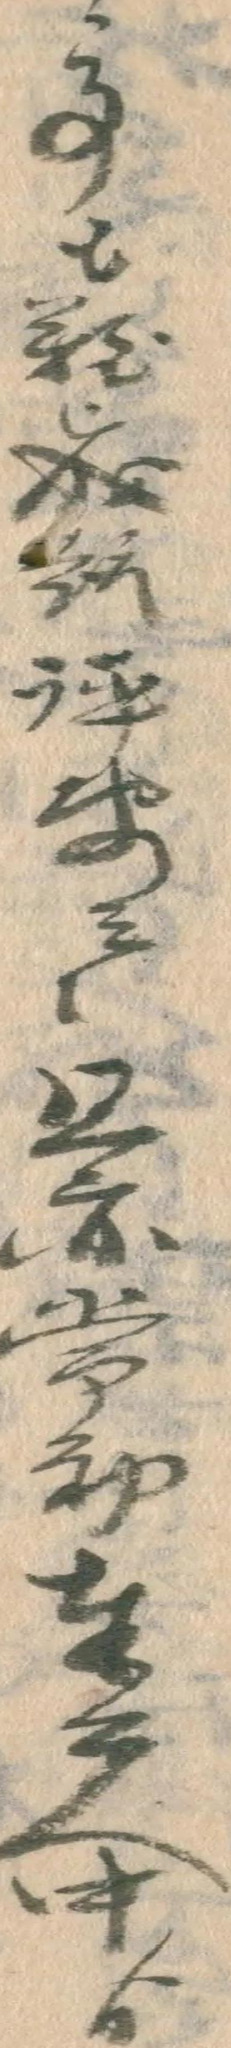候事も難被成所、評決云々、且亦常勤奉公人中ゟ
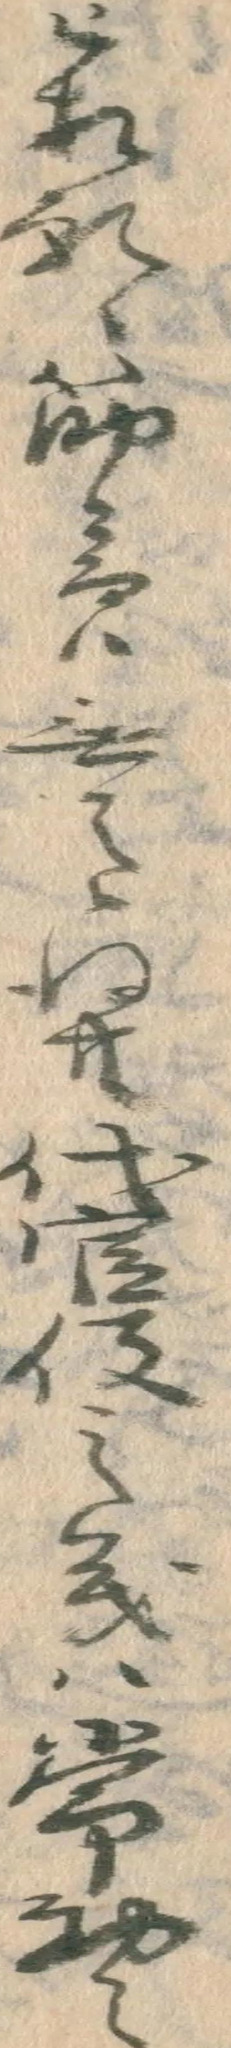被相願候筋ニ而ハ無之候得共、代官役之義ハ常勤之
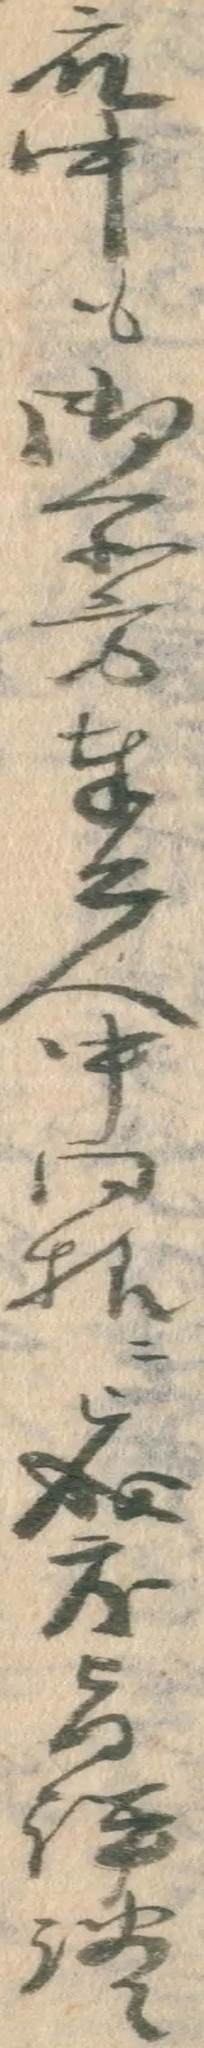衆中も御所方奉公人中同様に被成度ニ而、評決候
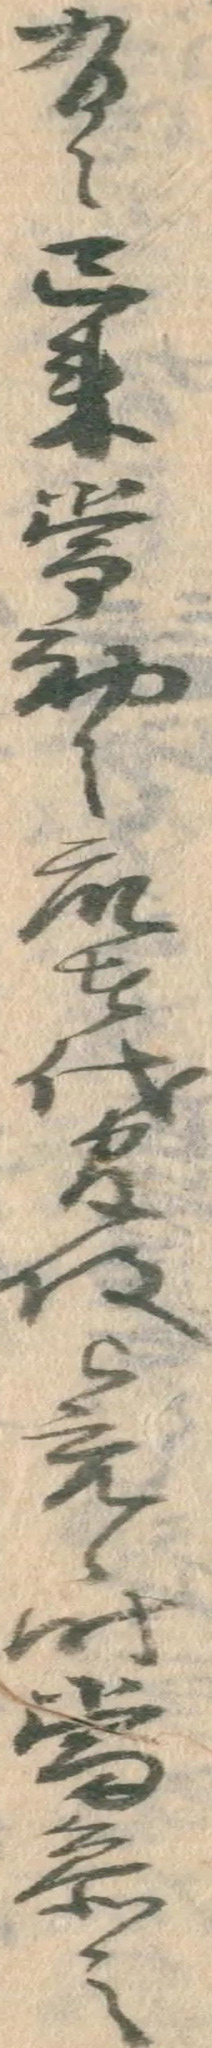有之、已来常勤之衆奉代官役被充候時、當参之
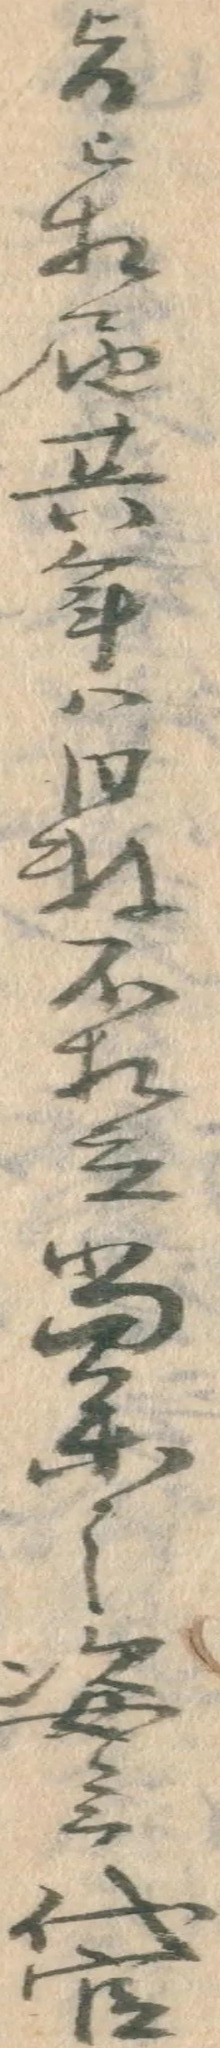旨被相届、其年ハ日数不相立、當参之姿ニ而、代官
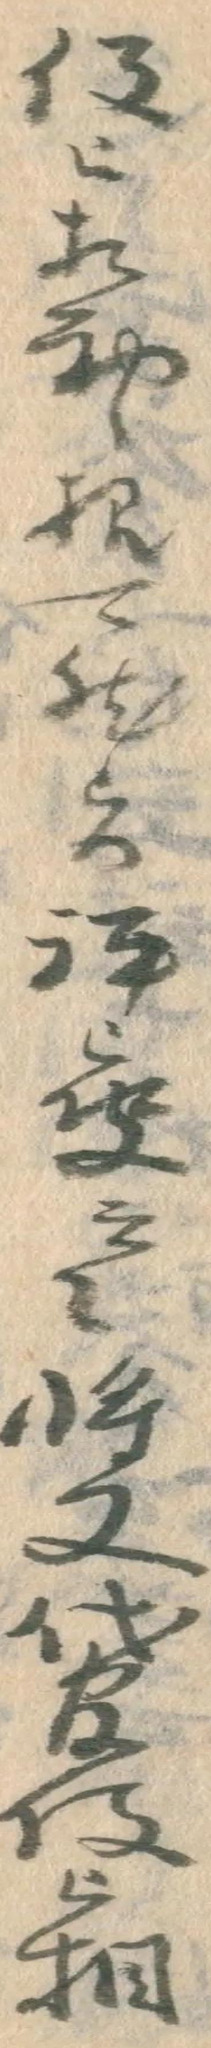役被相勤候様可然旨、評被決云々、将又、代官役被相
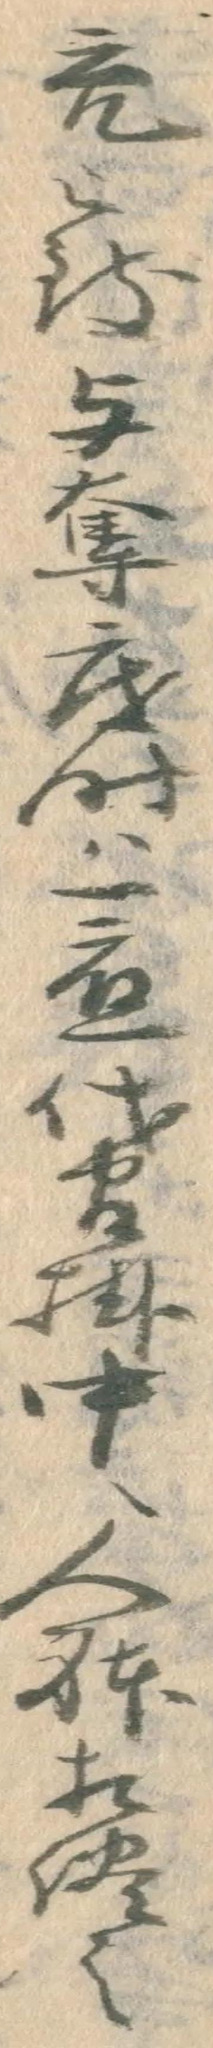充被致、与奪時ハ、一応代官掛中へ人躰相談之
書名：賀茂社記録. 第63冊
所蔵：国立国会図書館 National Diet Library, JAPAN
